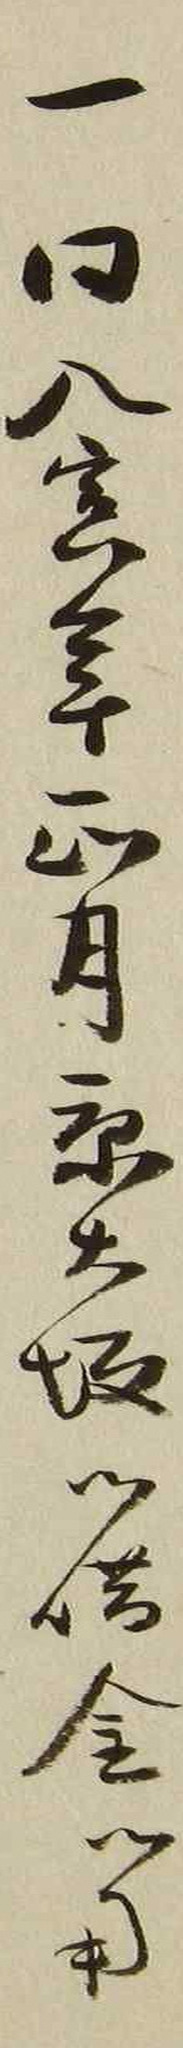一同八寅年正月京大坂御借金御用
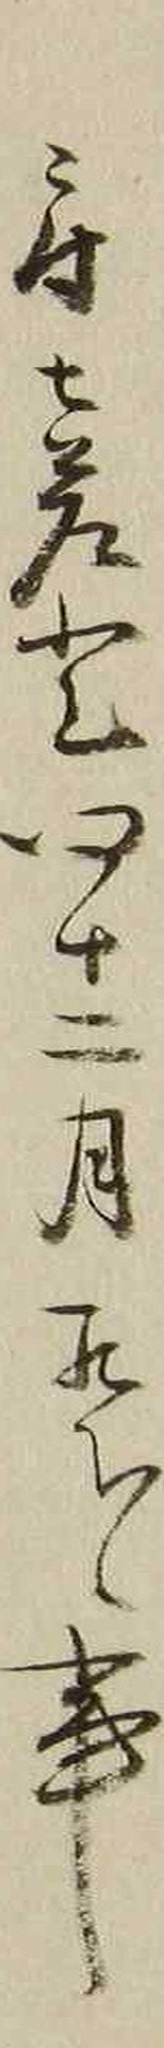ニ付被差登同十二月罷下候事
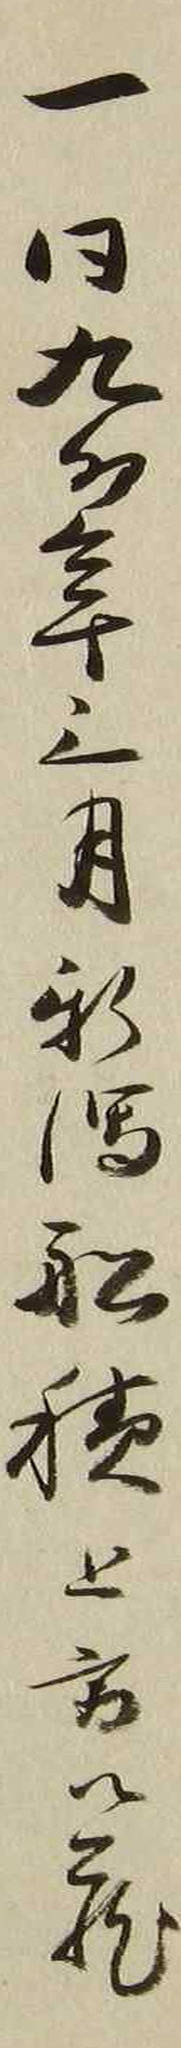一同九卯年三月新潟船積上方御蔵
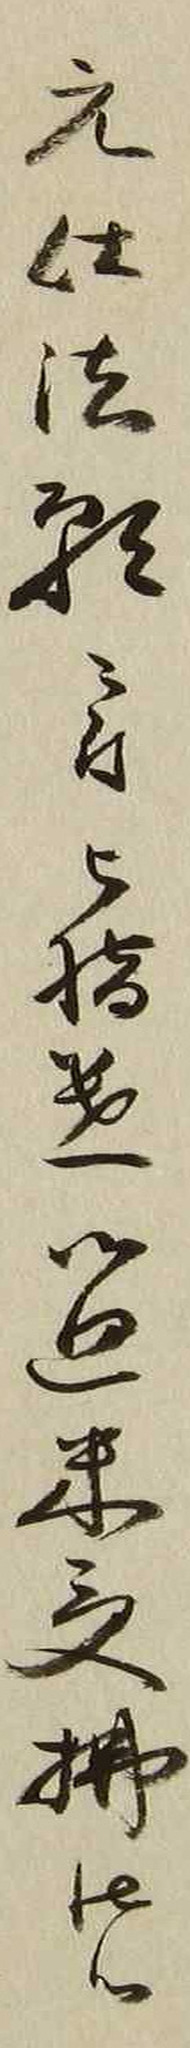元仕法願ニ付被指遣御廻米受払仕候
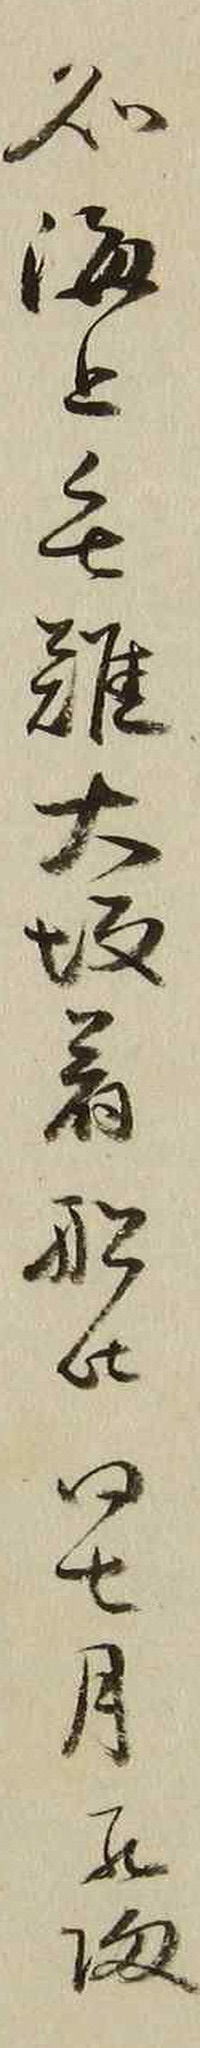処海上無難大坂着船仕同七月罷帰
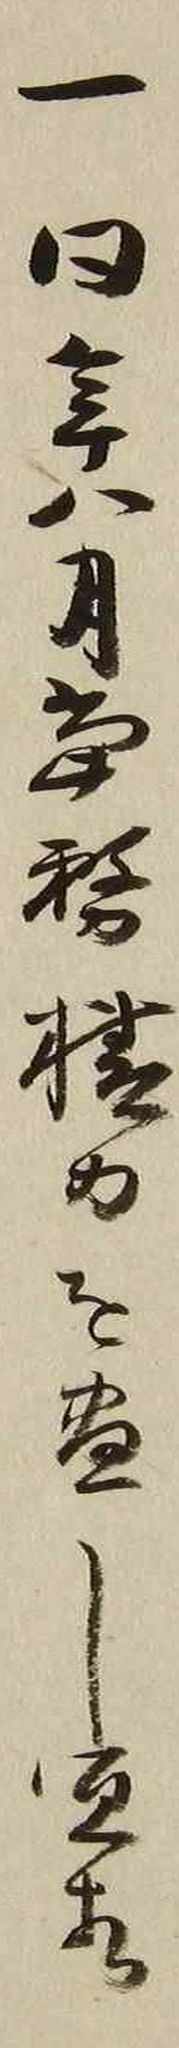一同年八月当務精力を尽し宜相
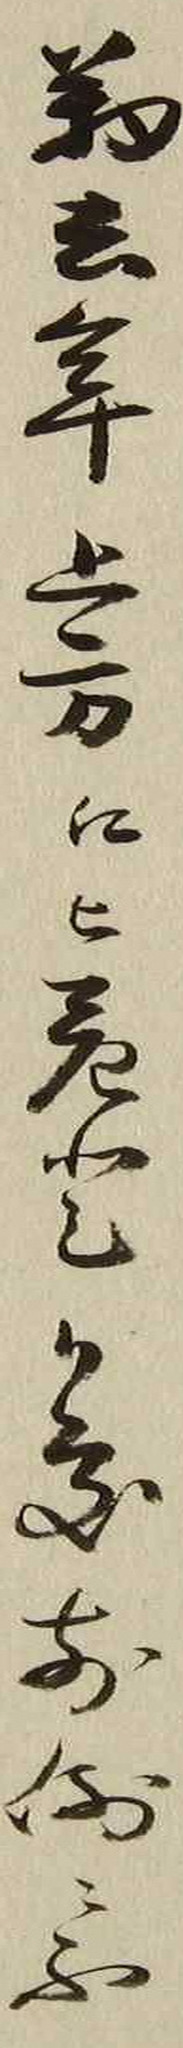勤去年上方江被差登候処前例ニ不
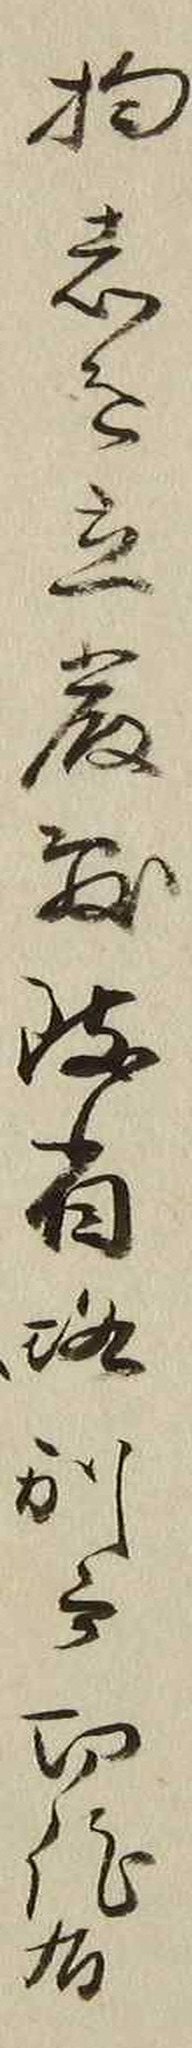拘志を立厳敷致省略別而功作有
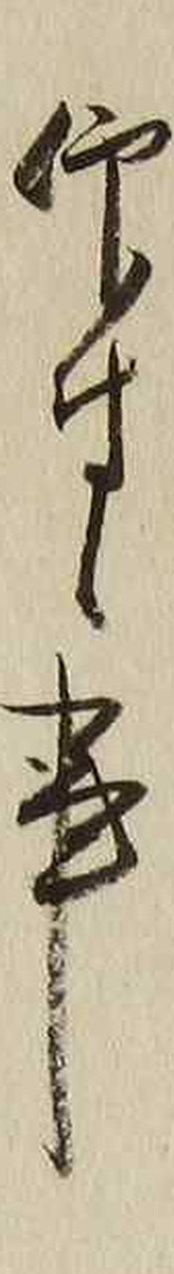仰付候事
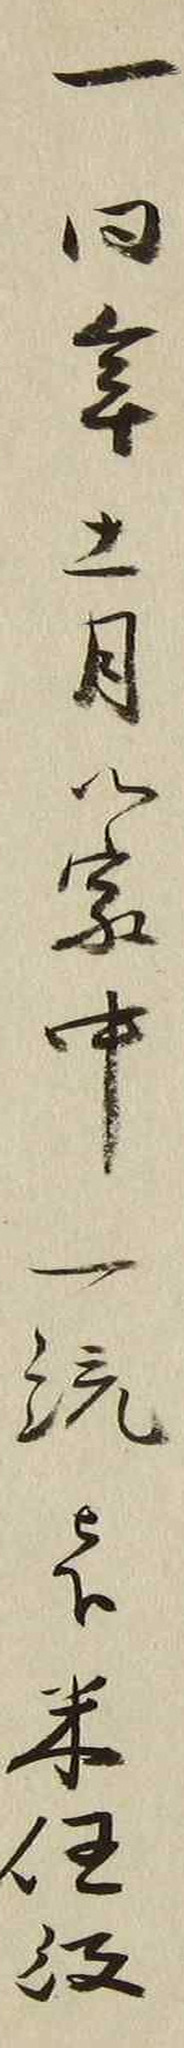一同年十一月御家中一統被下米任役
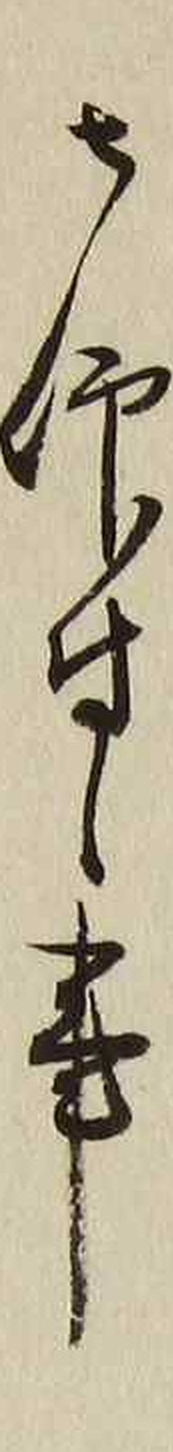被仰付候事
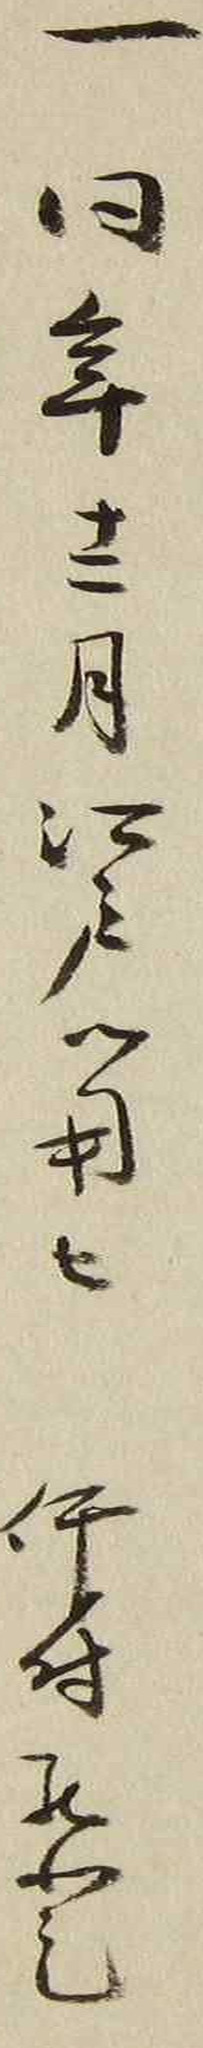一同年十二月江戸御用被仰付罷登
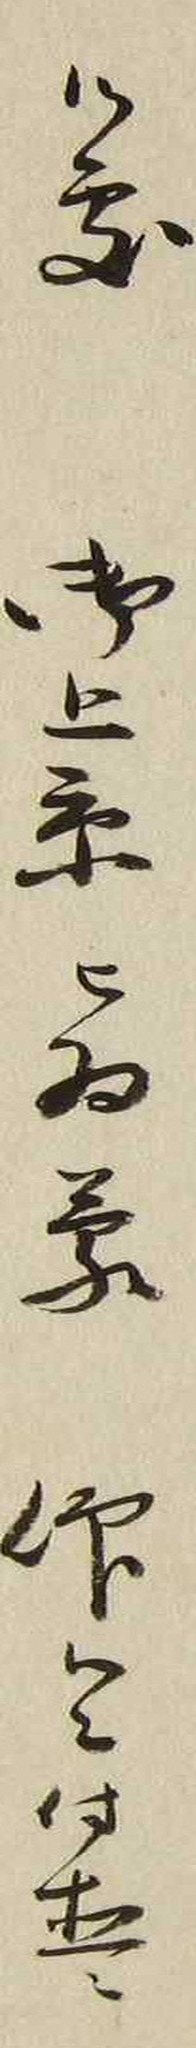候処御上京被為蒙仰候ニ付直ニ
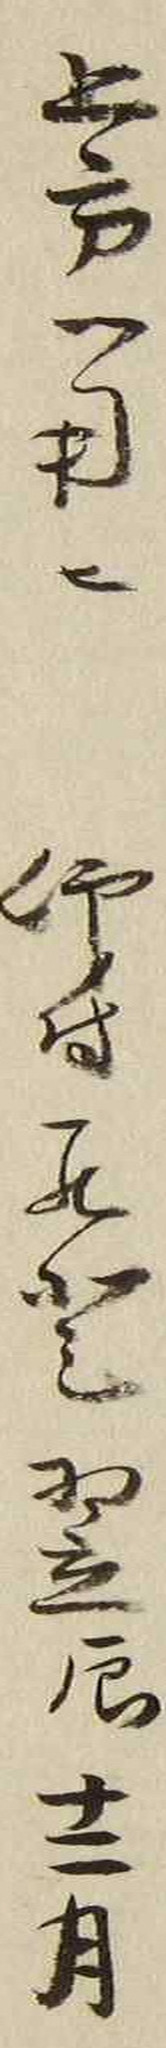上方御用被仰付罷登翌辰十二月
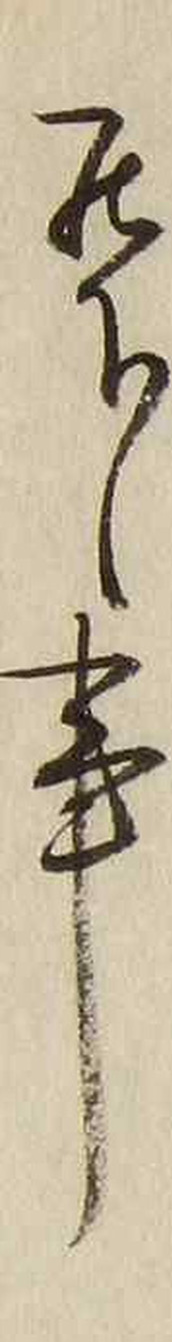罷下候事

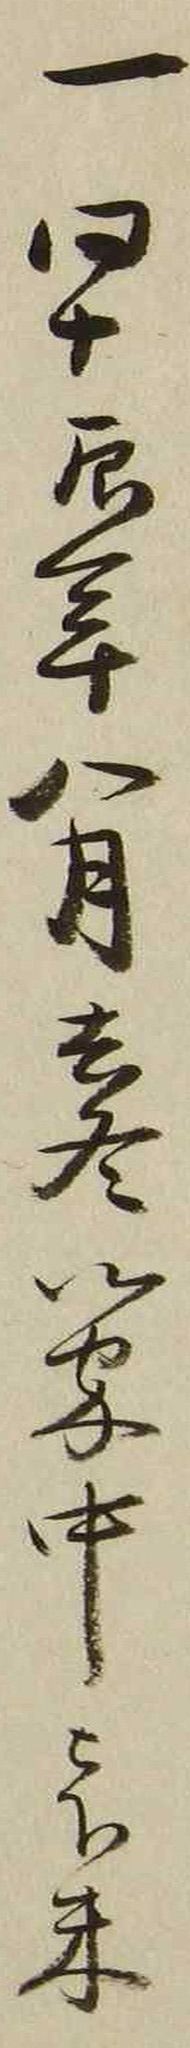一同十辰年八月去冬御家中被下米
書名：諸士系譜　巻之288　さ之部20
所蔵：会津若松市立会津図書館
